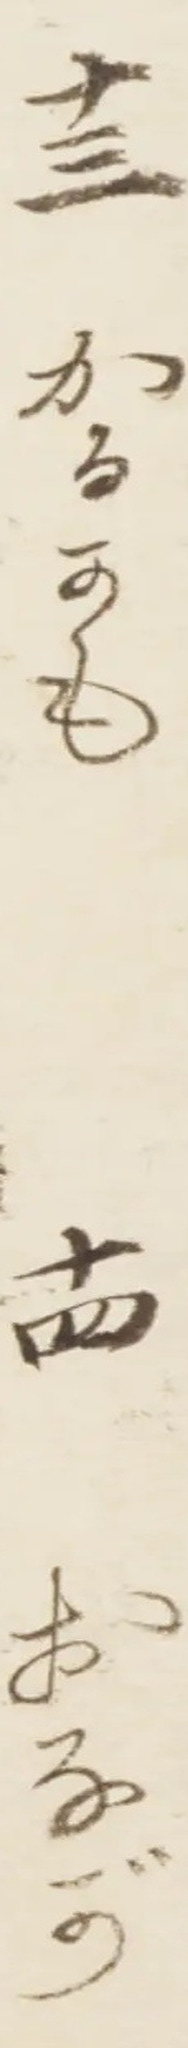十二かるかも十四おなが
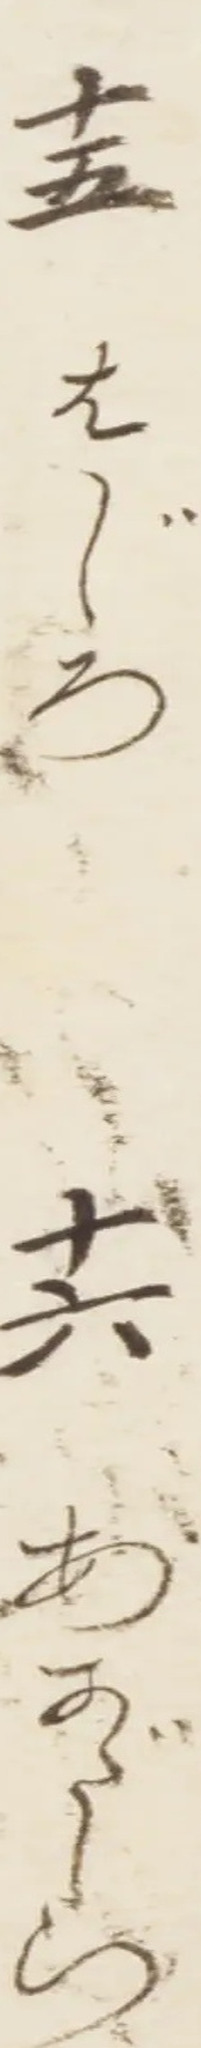十五はじろ十六あかゞしら
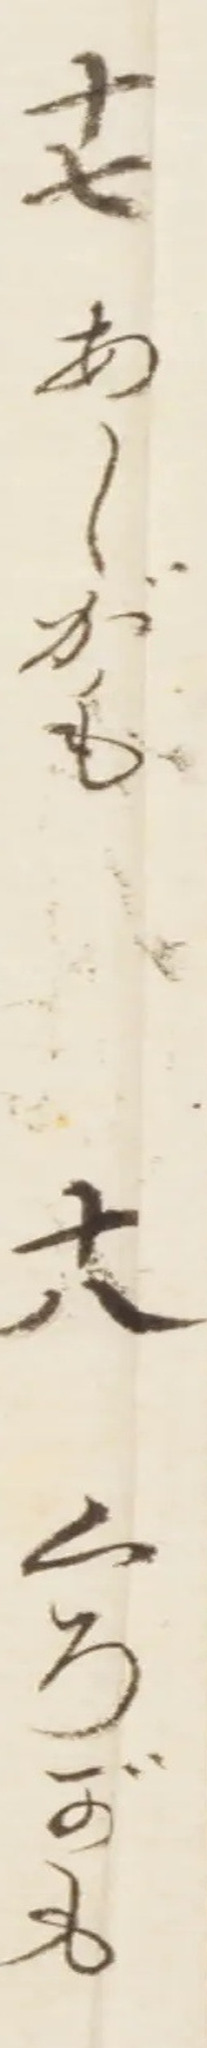十七あしがも十八くろがも
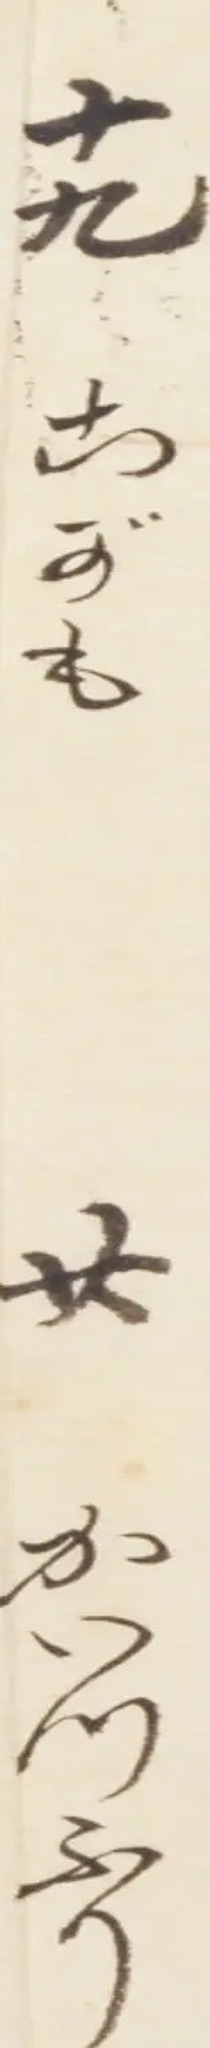十九こがも廿かいつふり
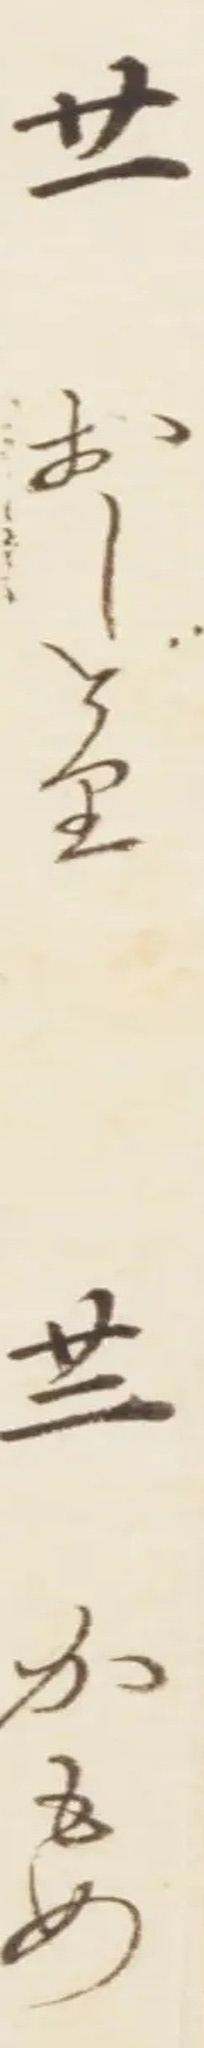廿一おしどり廿二かもめ
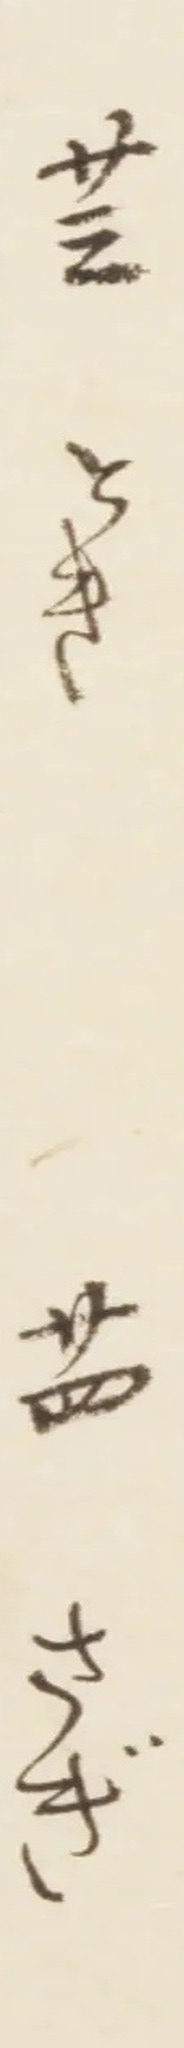廿三とき廿四さぎ
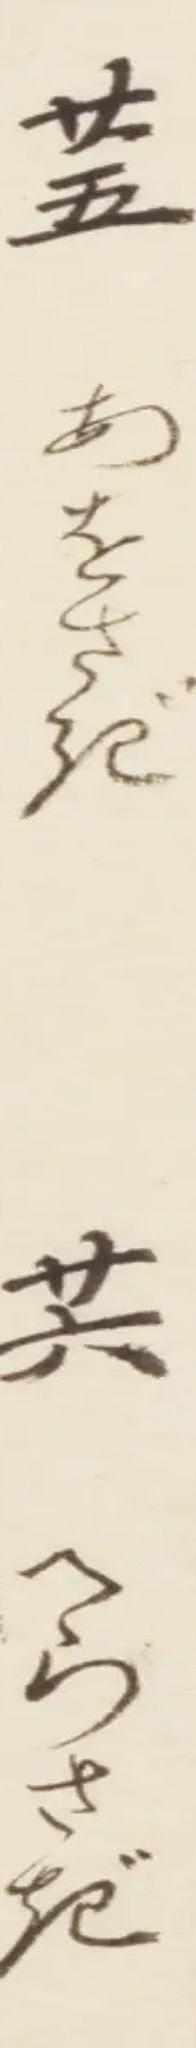廿五あをさぎ廿六へらさぎ
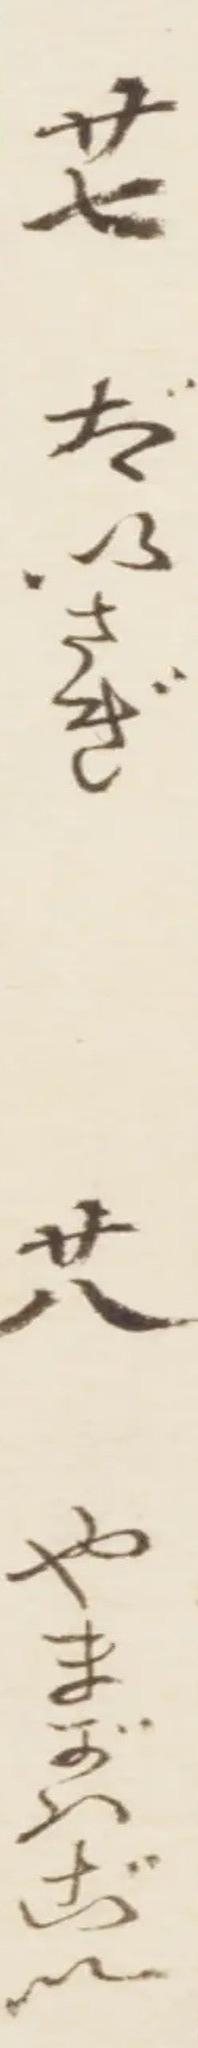廿七だいさぎ廿八やまがはごい
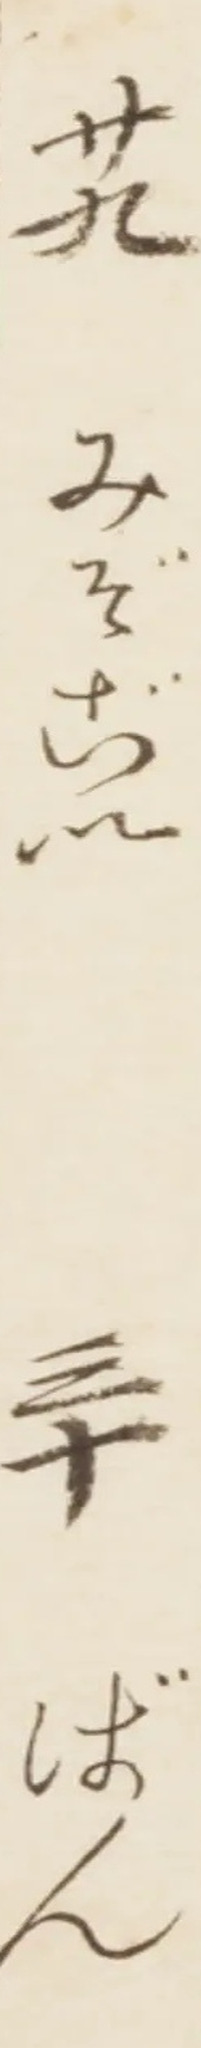廿九みぞごい三十ばん
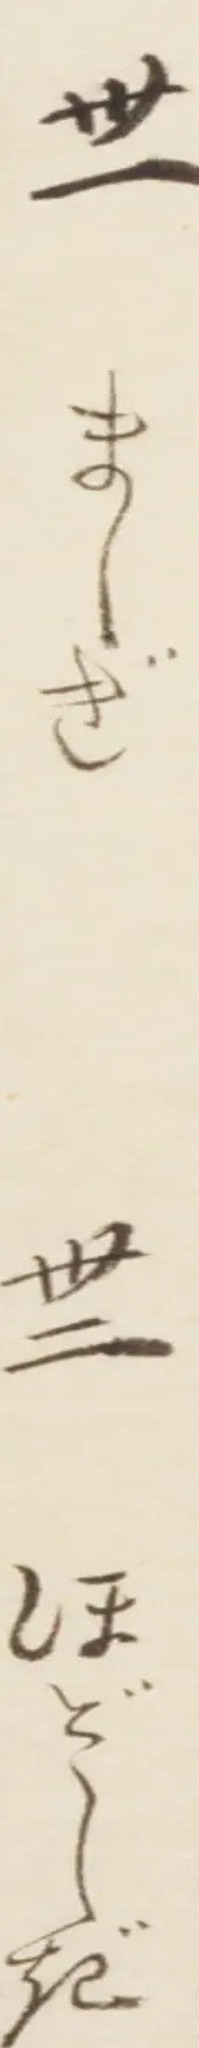卅一ましぎ卅二ほどしぎ
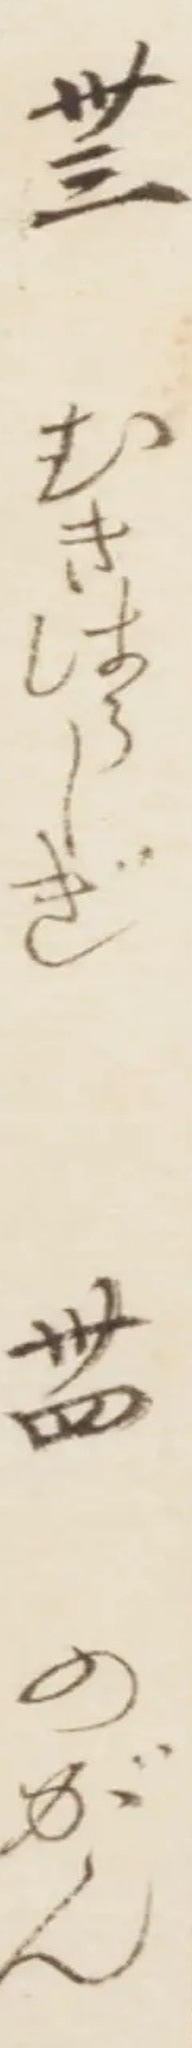卅三むきはらしぎ卅四のがん
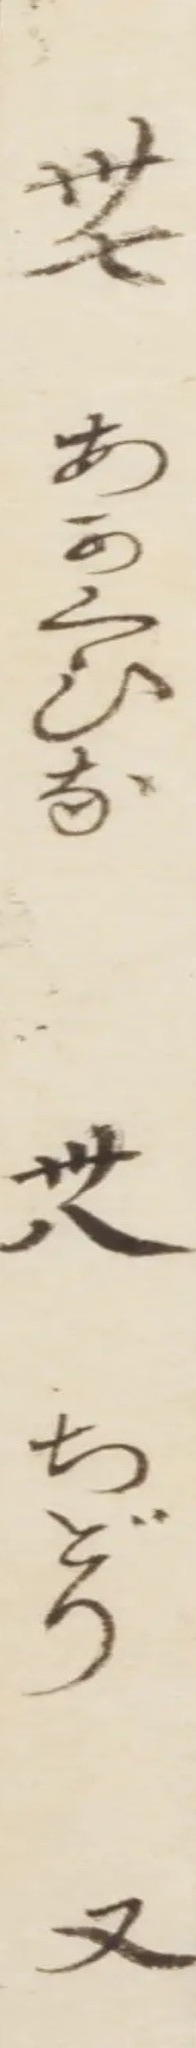卅七あかくひな卅八ちどり又

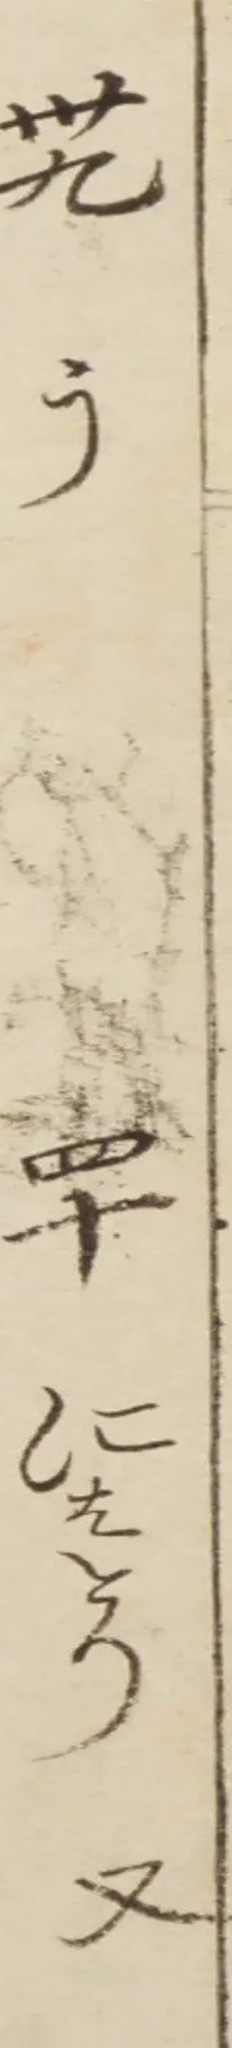卅九う四十にはとり又
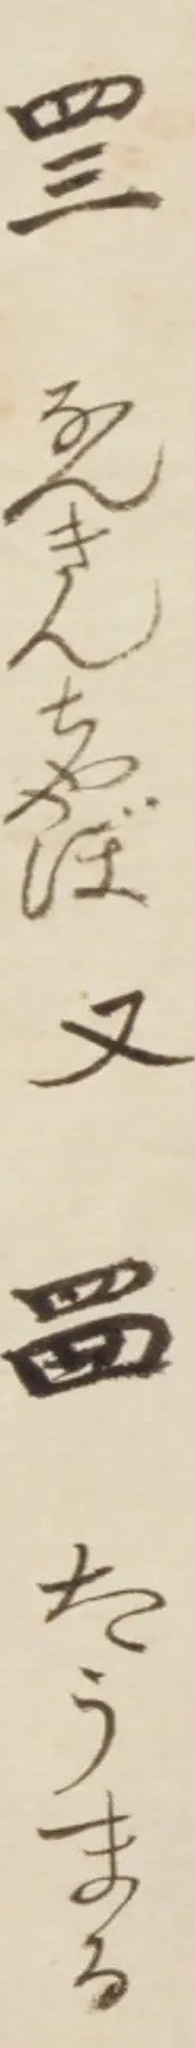四三なんきんちやぼ又四四たうまる
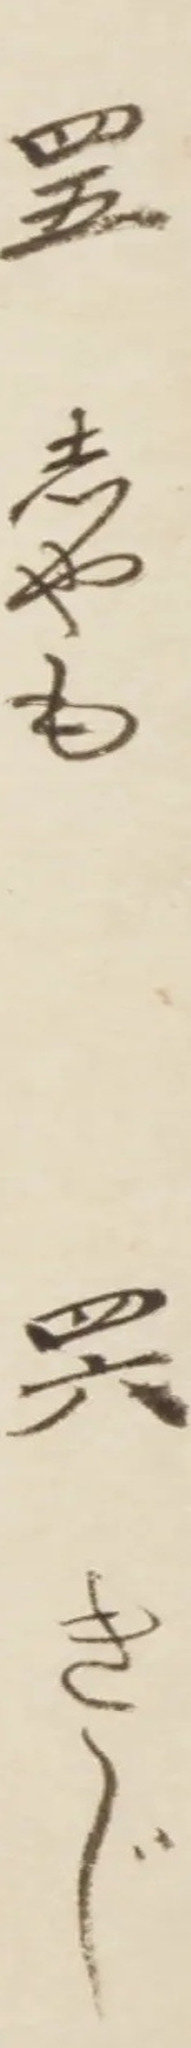四五しやも四六きじ
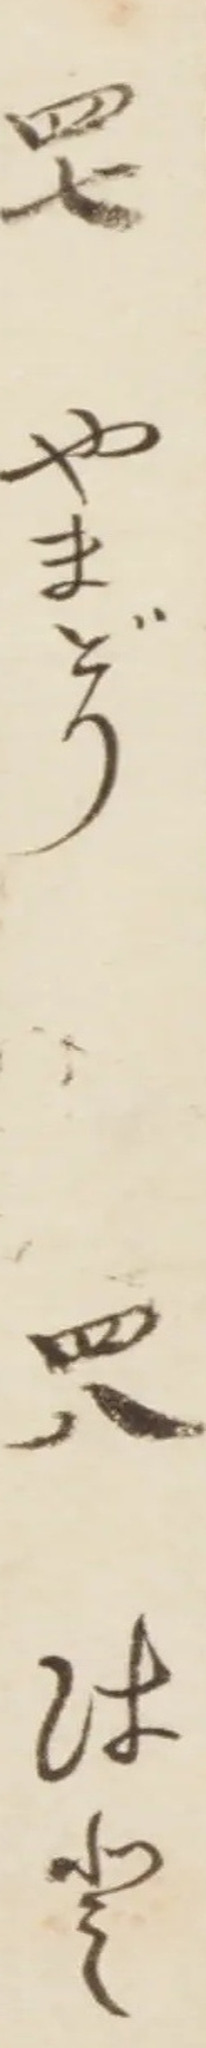四七やまどり四八はと
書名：華鳥譜
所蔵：国立国会図書館 National Diet Library, JAPAN
